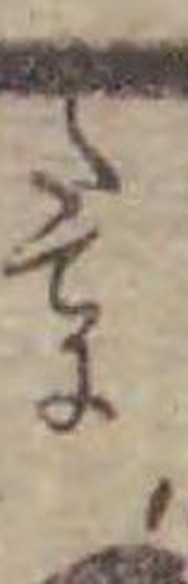たてに
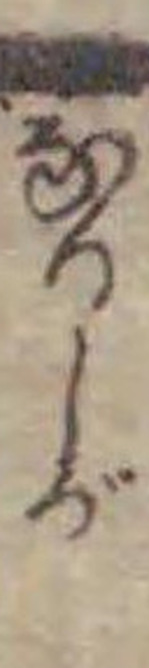なりしが
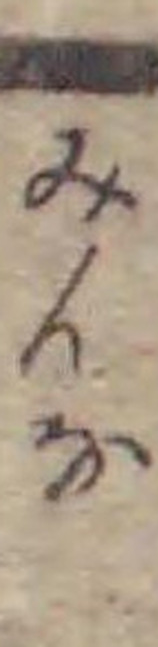みんな
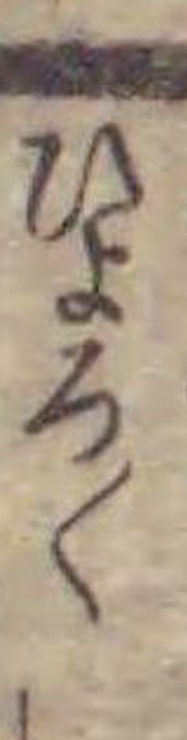ひよろ〳〵
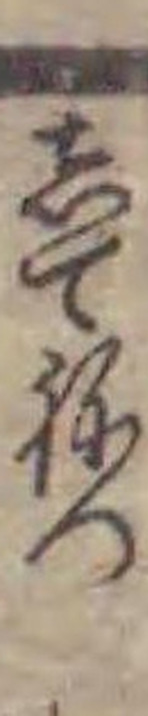してねつ
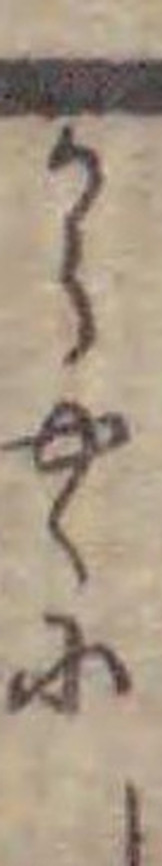からやくに
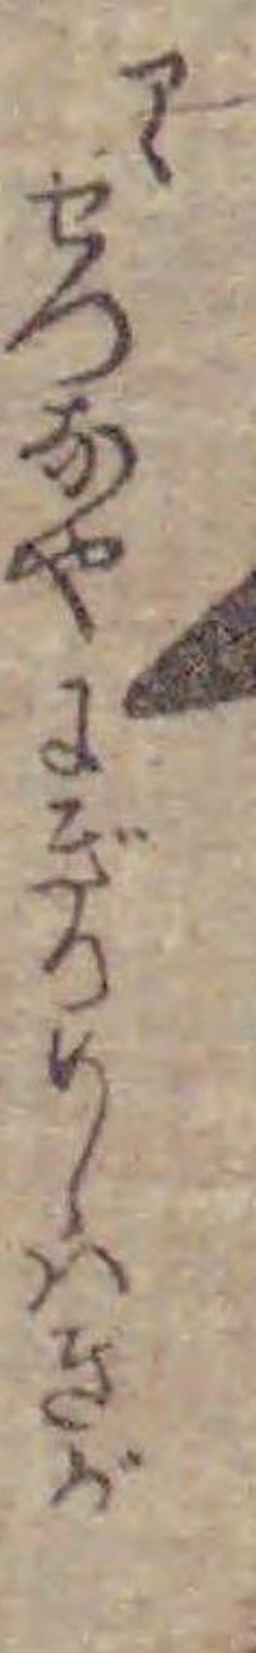せつなやにぎりめしはきが
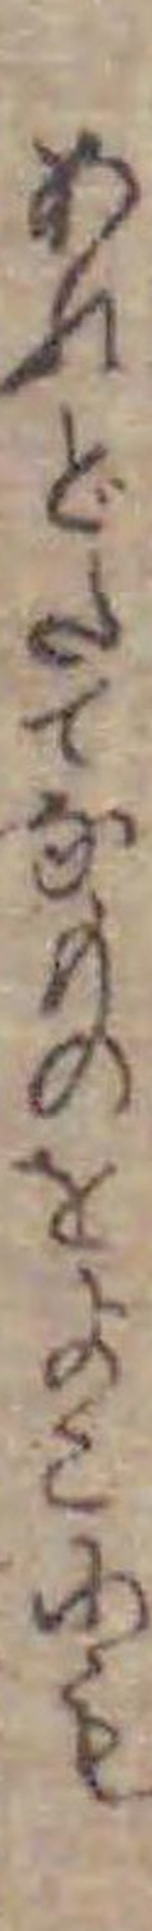あれどたてなものをよこにも
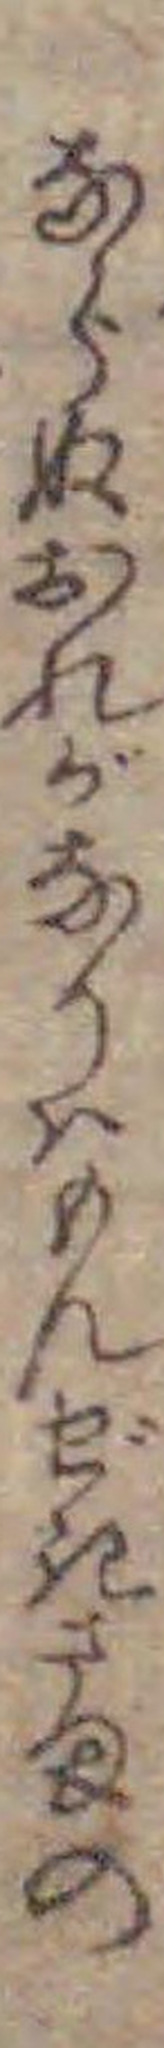ならぬおれがなりはもんぜきさまの
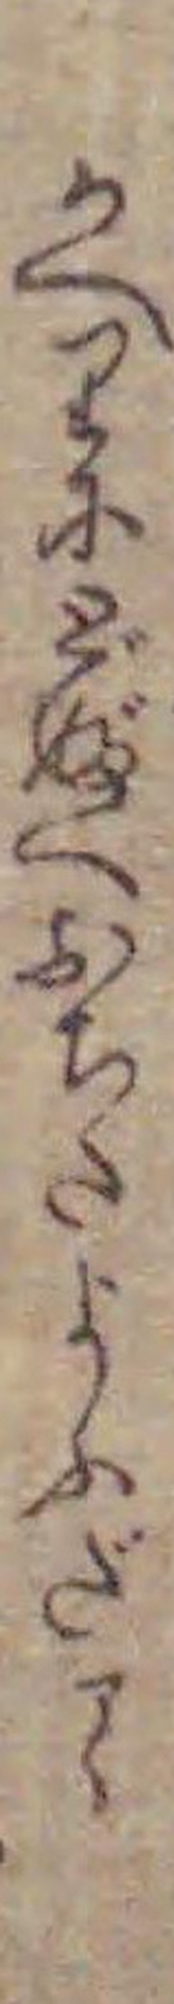かへりにどぶへおちたよふだヽ
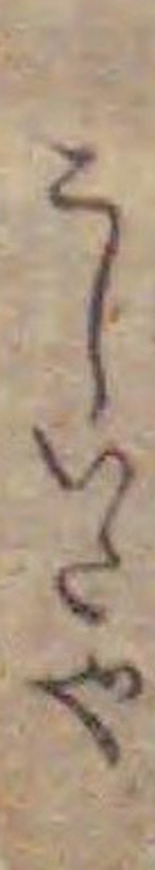こしいたや

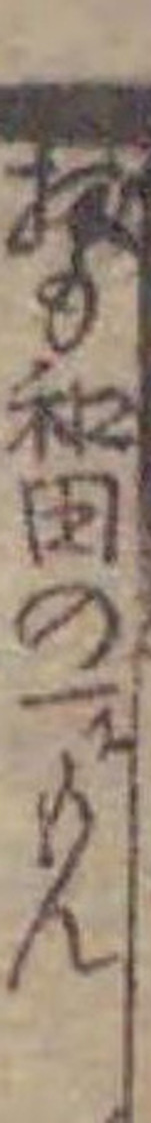扨も和田の一もん
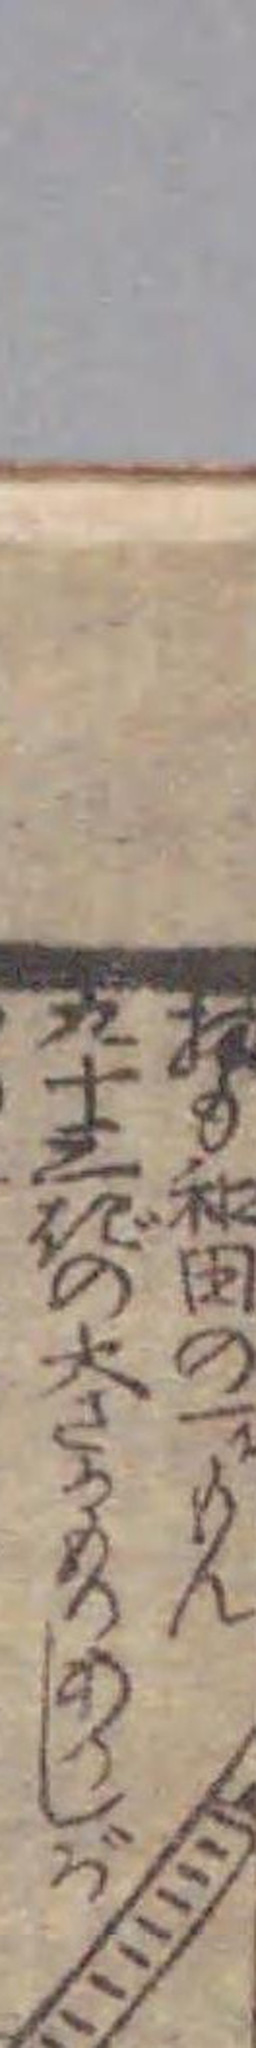九十三ぎの大さかもりありしが
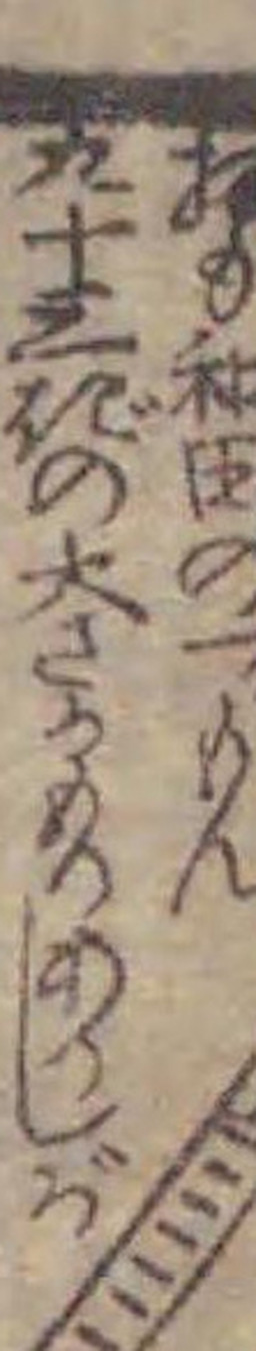九十三ぎの大さかもりありしが
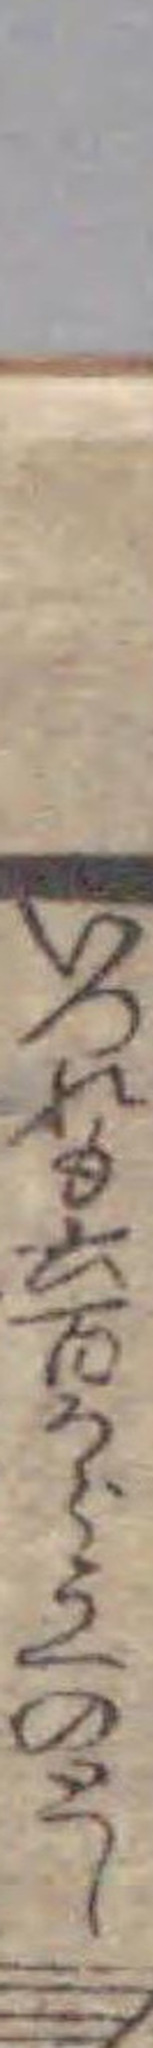いつれも六百からうへのとし
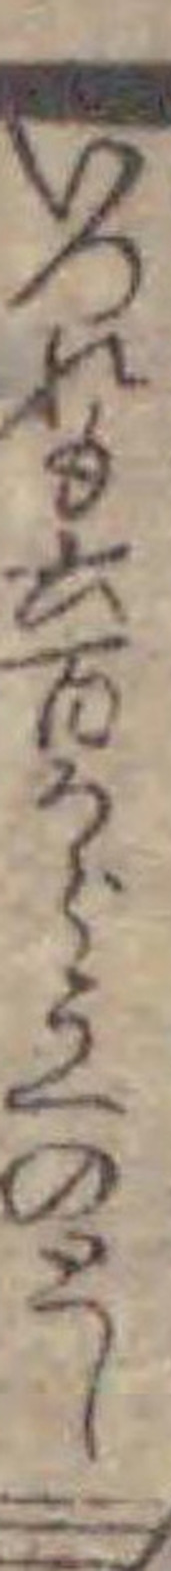いつれも六百からうへのとし
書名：年寄之冷水曽我 : 3巻
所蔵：国立国会図書館 National Diet Library, JAPAN
